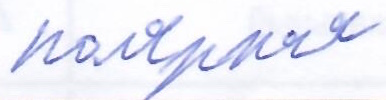полярная
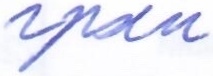грач
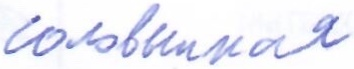соловыиная
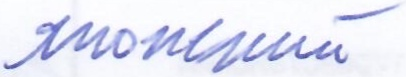японский
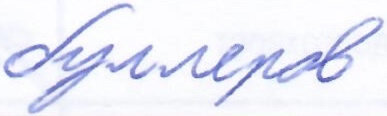буллеров
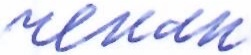чекан
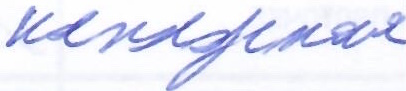канадская
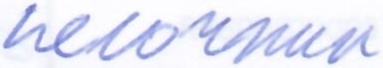песочник
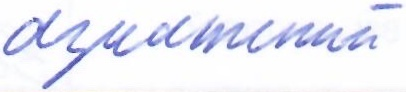азиатский
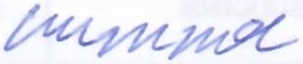питта
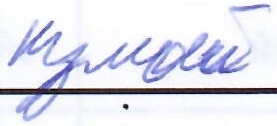кумай
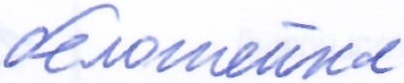белошейка
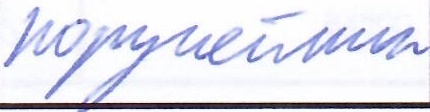поручейник
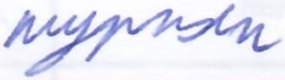турпан
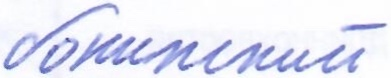бонинский
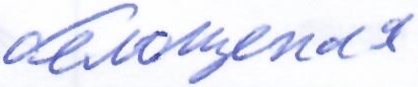белощекая
